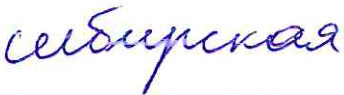сибирская
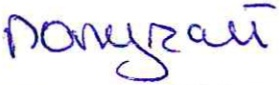попугай
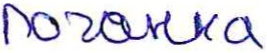поганка
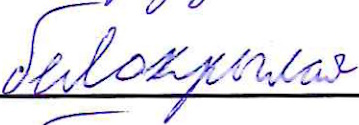белокрылая
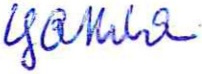цапля
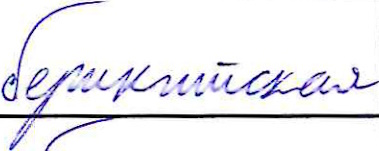берингийская
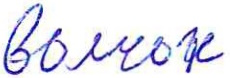волчок
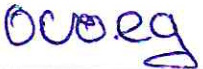осоед
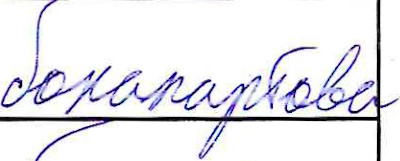бонапартова
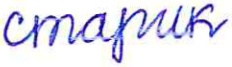старик
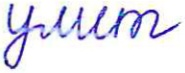улит
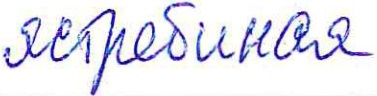ястребиная
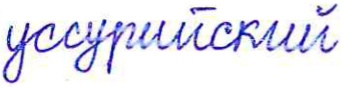уссурийский
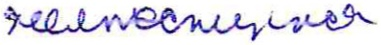желтоспинная
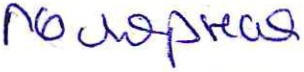полярная
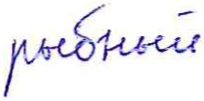рыбный
